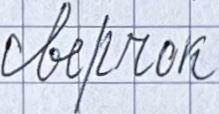сверчок
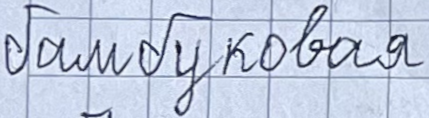бамбуковая
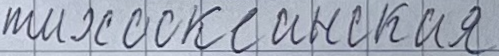тихоокеанская
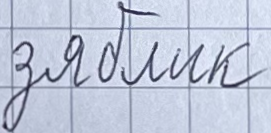зяблик
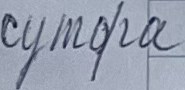сутора
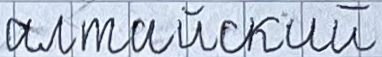алтайский
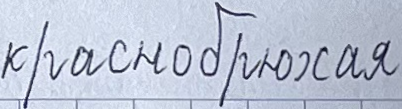краснобрюхая
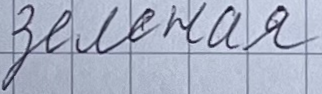зеленая
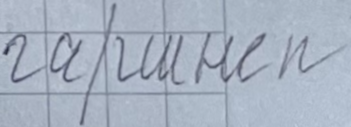гаршнеп
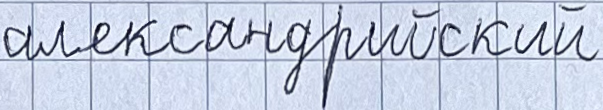александрийский
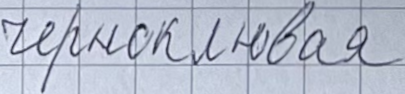черноклювая
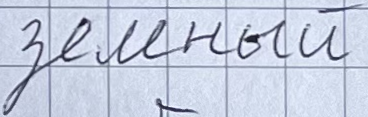зеленый
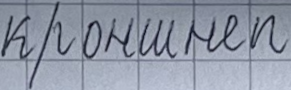кроншнеп
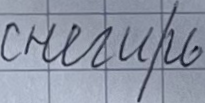снегирь
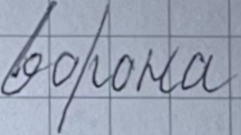ворона
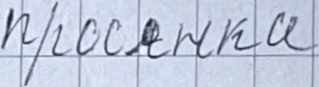просянка
